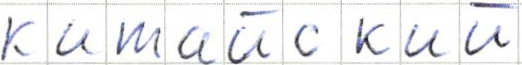китайский
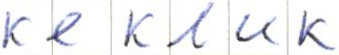кеклик
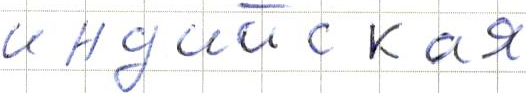индийская
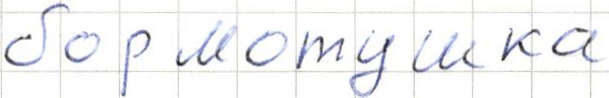бормотушка
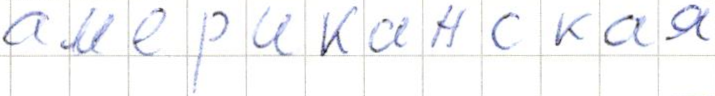американская
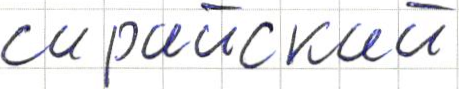сирийский
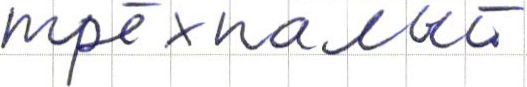трёхпалый
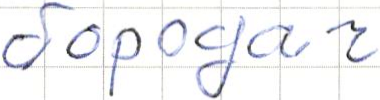бородач
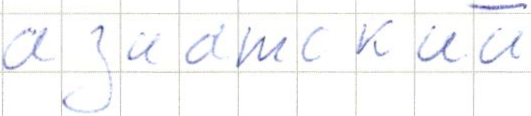азиатский
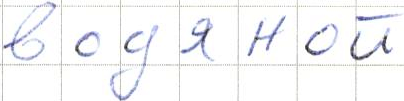водяной
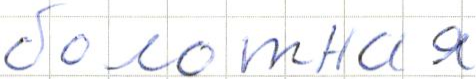болотная
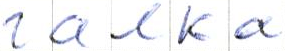галка
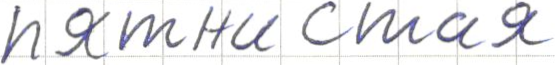пятнистая
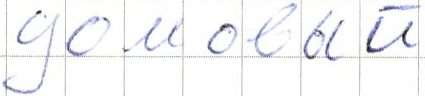домовый
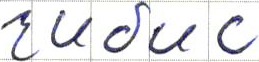чибис
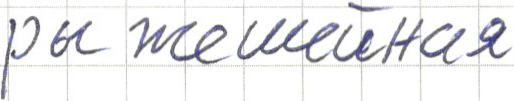рыжешейная
